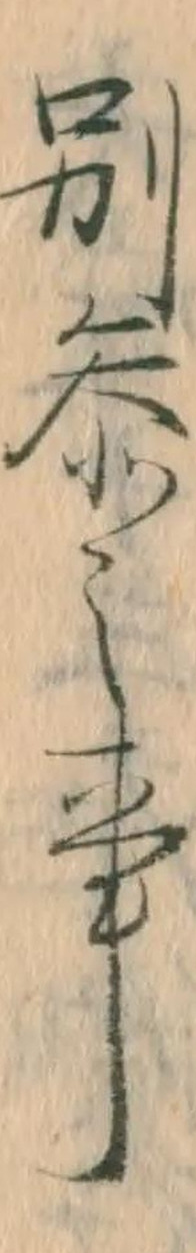別参之事
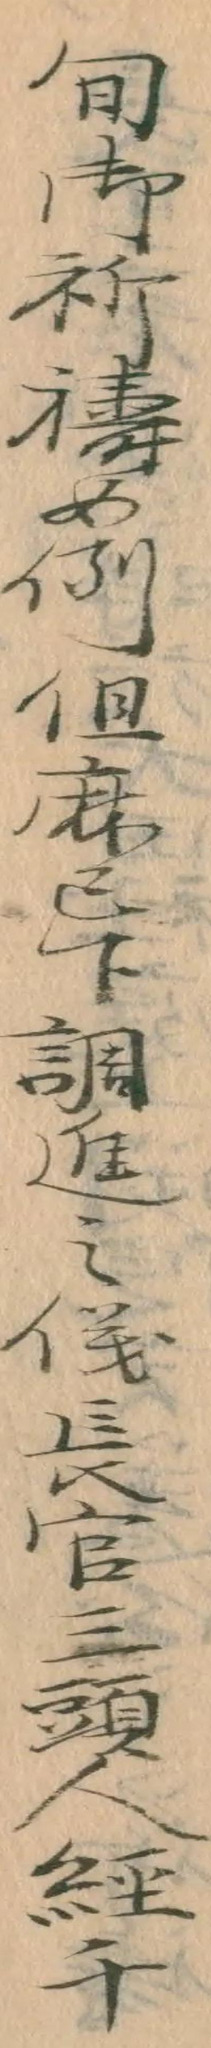一旬御祈祷如例但麻已下調進之儀長官三頭人経千
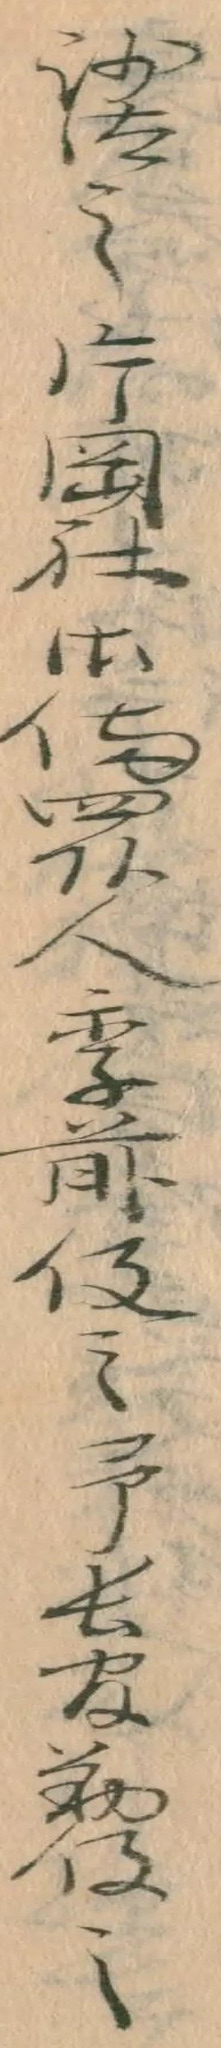沙汰之片岡社御侍四頭人季前役之予長官勤役之
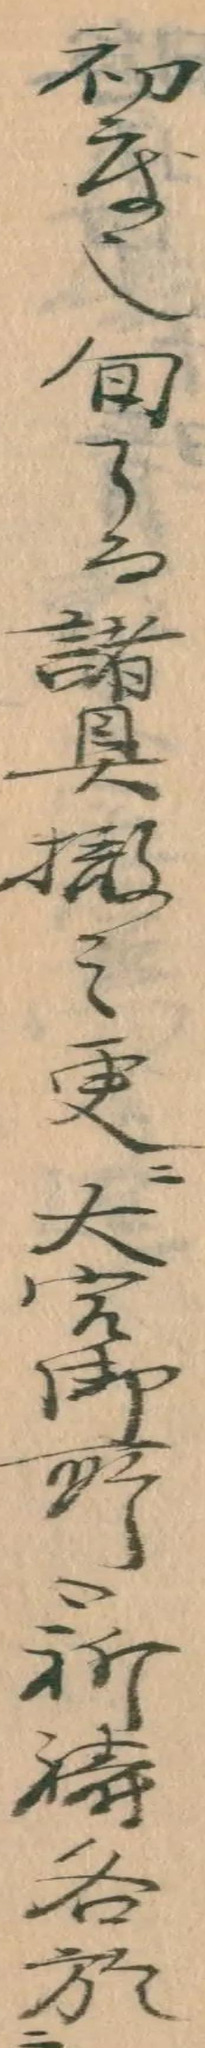初度也旬了而諸具撒之更ニ大宮御所御祈祷各於
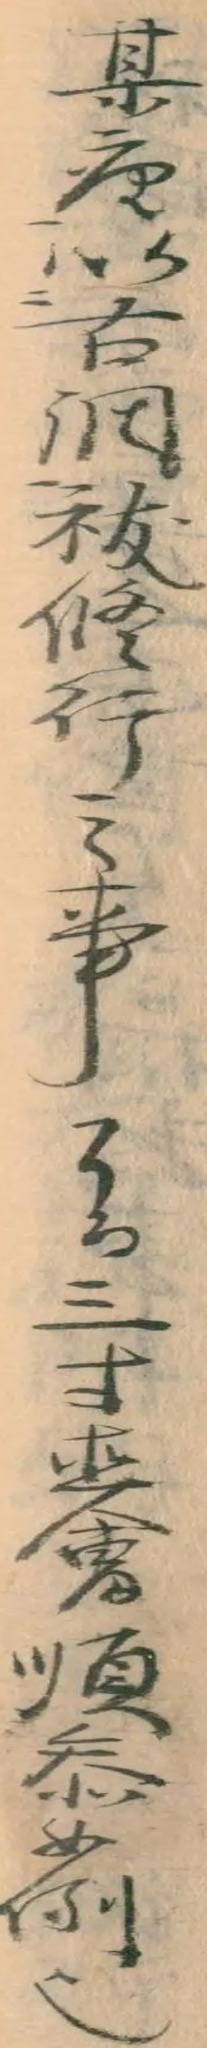某座以古調祓修行之事了而三寸直會順恭如例也
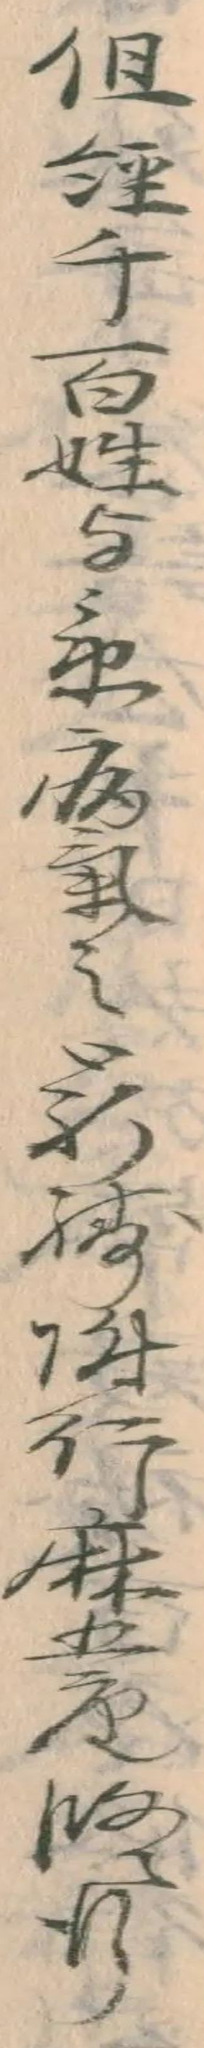但経千百姓与兵衛病氣之御祈祷附行麻五座修行
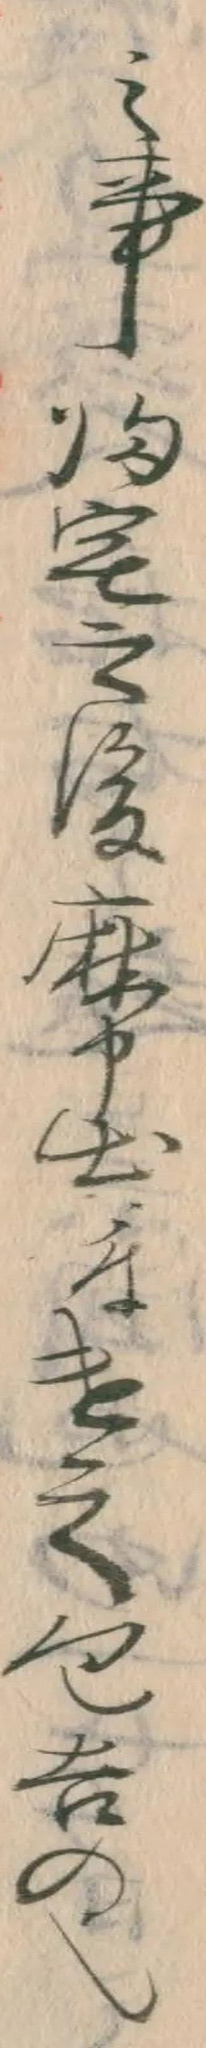之事帰宅之後麻申出ニ付遣也包吉の也
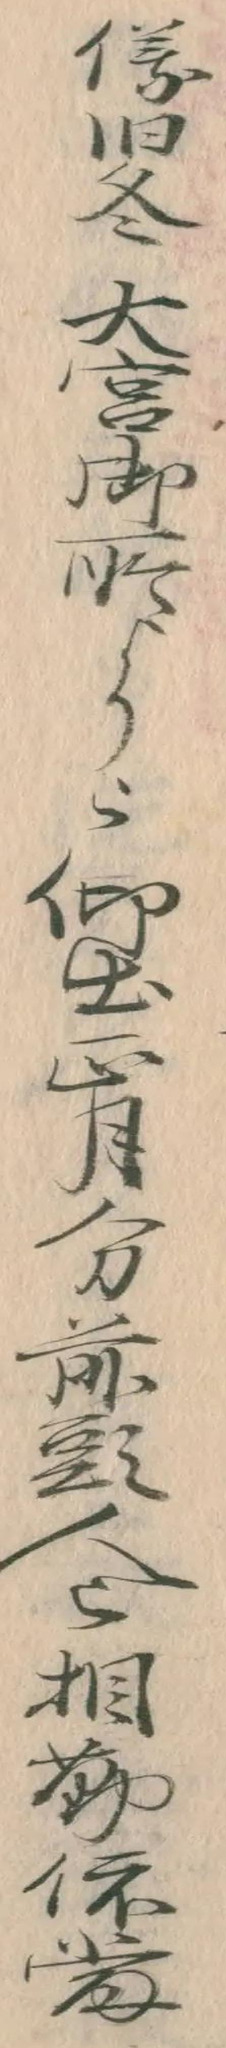儀旧冬大宮御所より被仰出正月分前頭人被相勤依當
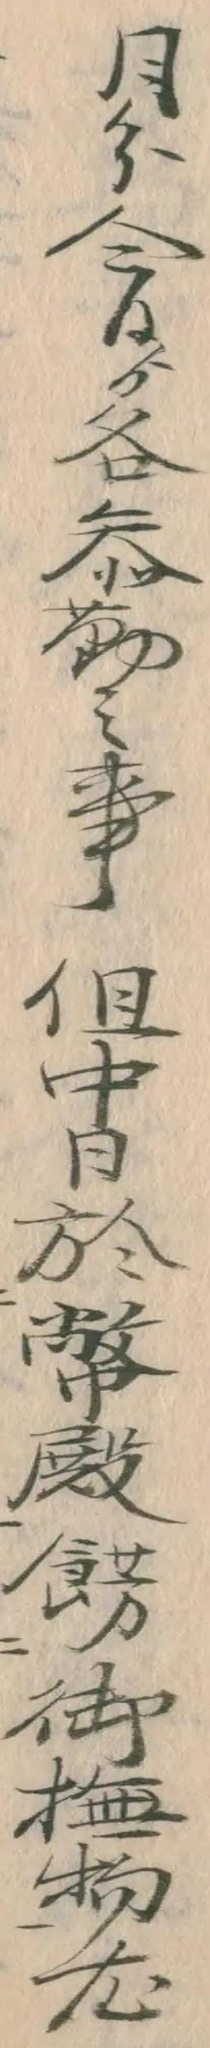月分今日ゟ各参勤之事但中日於幣殿餝御撫物尤
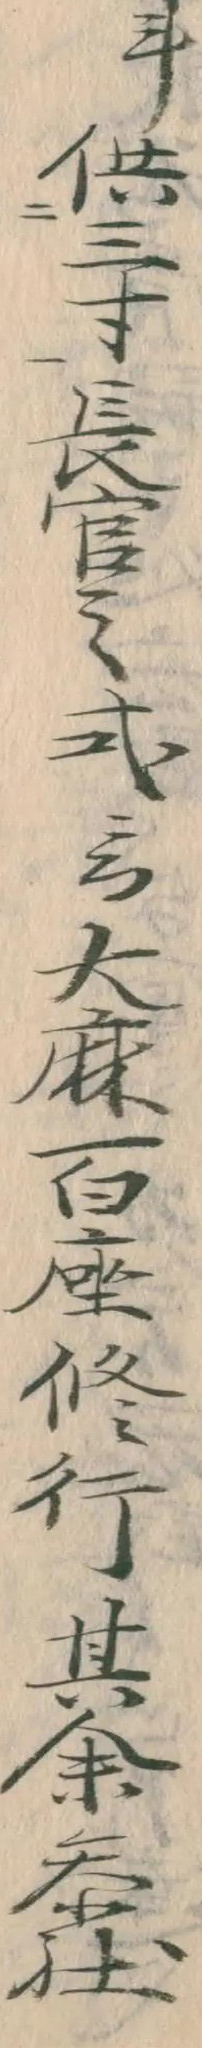禁中斗供三寸長官之式ニ而大麻百座修行其余参社
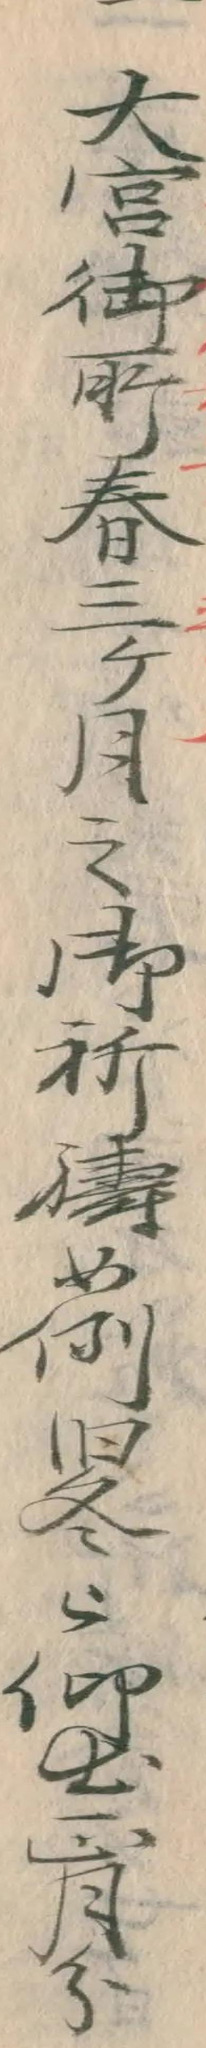一大宮御所春三ヶ月之御祈祷如例旧冬被仰出正月分
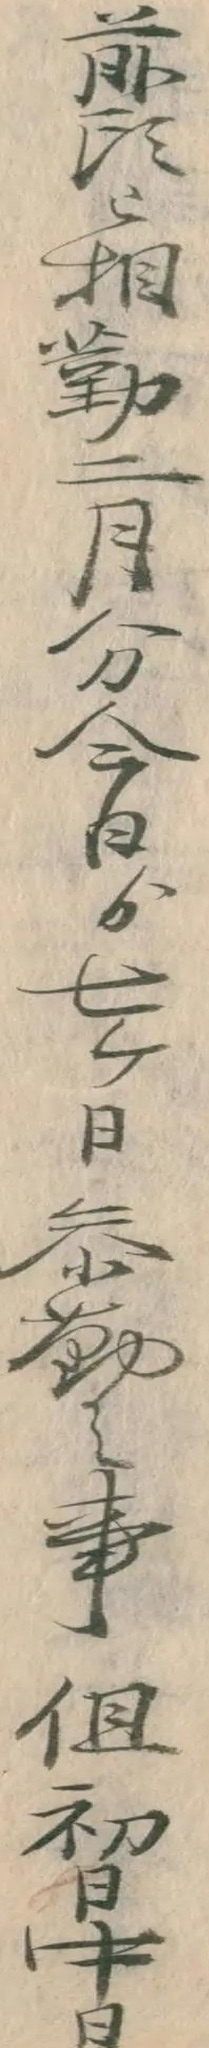前頭被相勤二月分今日ゟ七ケ日参勤之事但初日中日

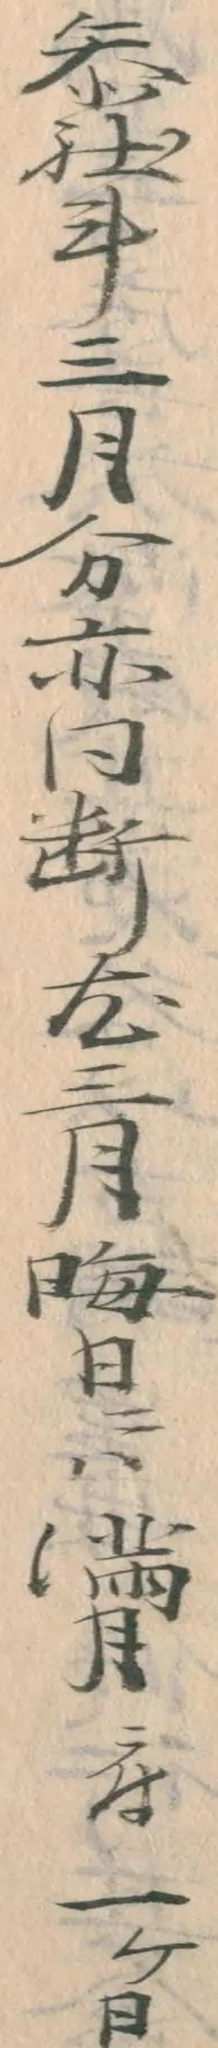参社斗三月分亦同断尤三月晦日ニハ満月ニ付一ケ日
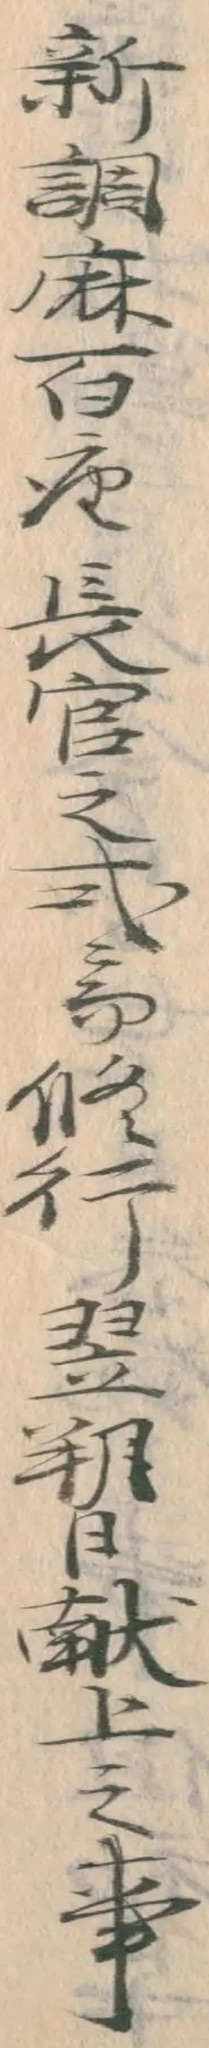新調麻百座長官之式ニ而修行翌朔日献上之事
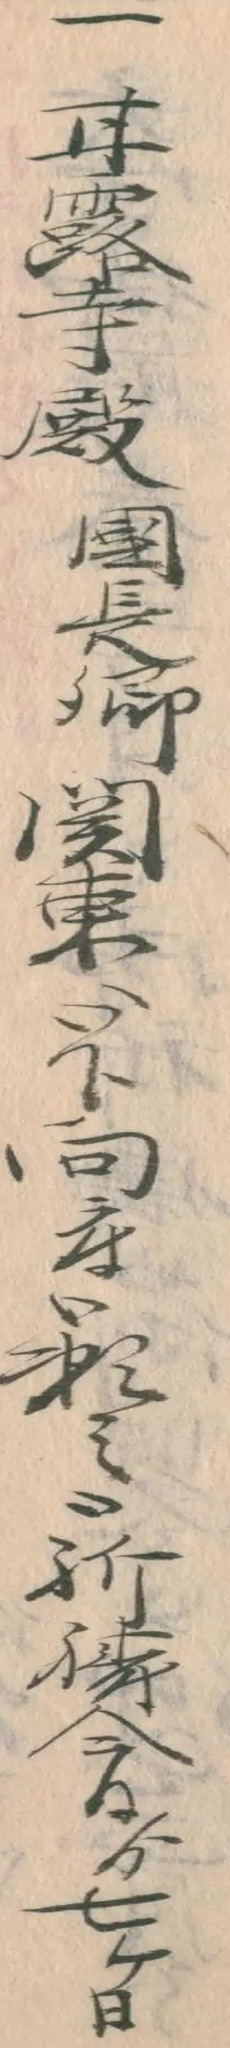一甘露寺殿國長卿関東へ御下向ニ付頼之御祈祷今日ゟ七ケ日
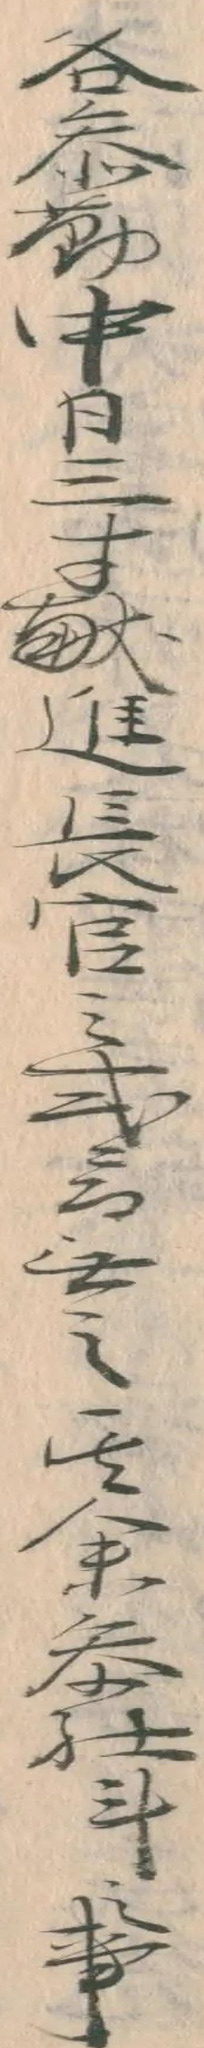各参勤中日三寸献進長官之式ニ而無之其余参社斗之事
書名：賀茂社記録. 第72冊
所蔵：国立国会図書館 National Diet Library, JAPAN
